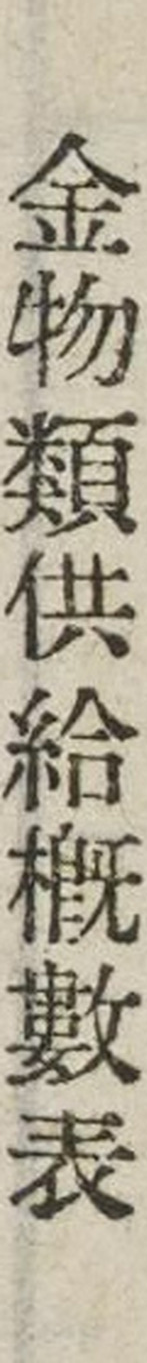金物類供給概数表

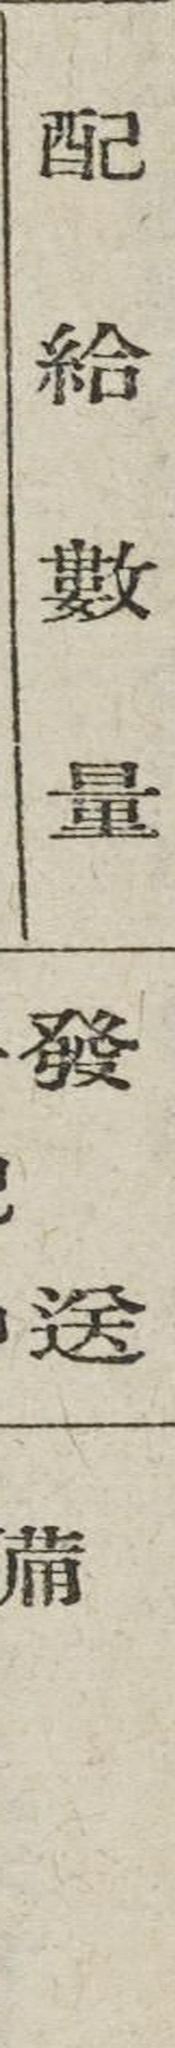配給数量発送
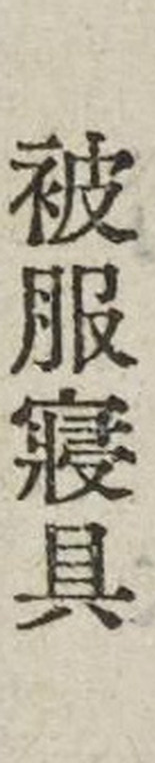被覆寝具
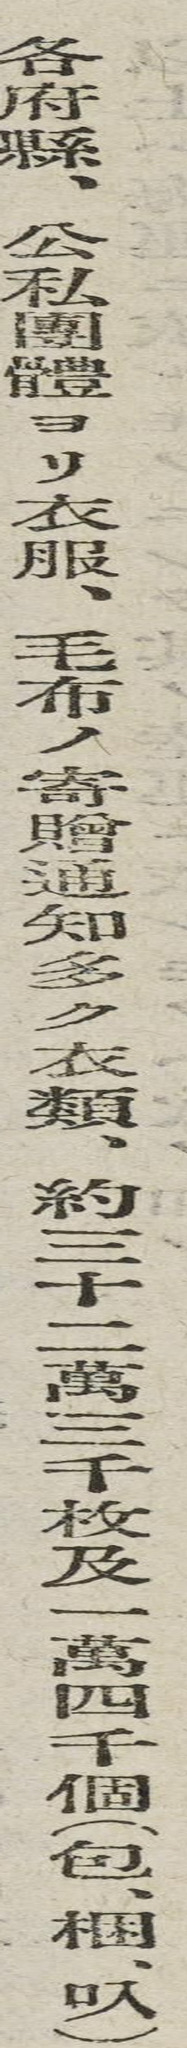各府県、公私団体ヨリ衣服、毛布ノ寄贈通知多ク衣類、約三十二万三千枚及一万四千個
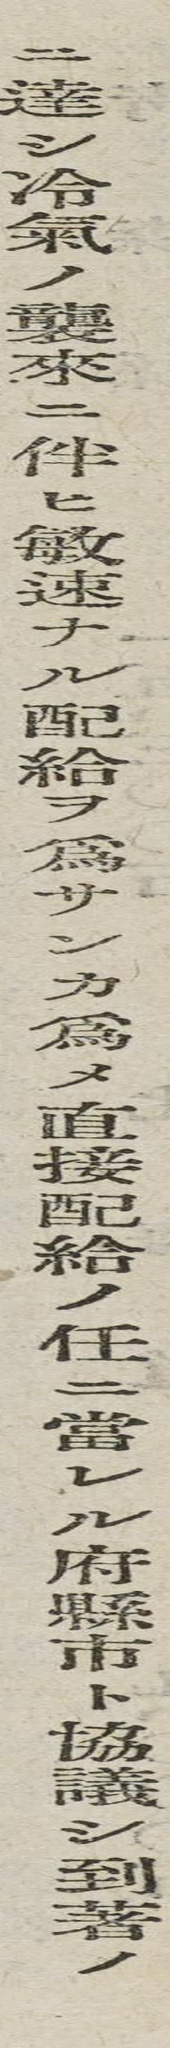ニ達シ冷気ノ襲来ニ伴ヒ敏速ナル配給ヲ為サンカ為メ直接配給ノ任ニ当レル府県市ト協議シ到着ノ
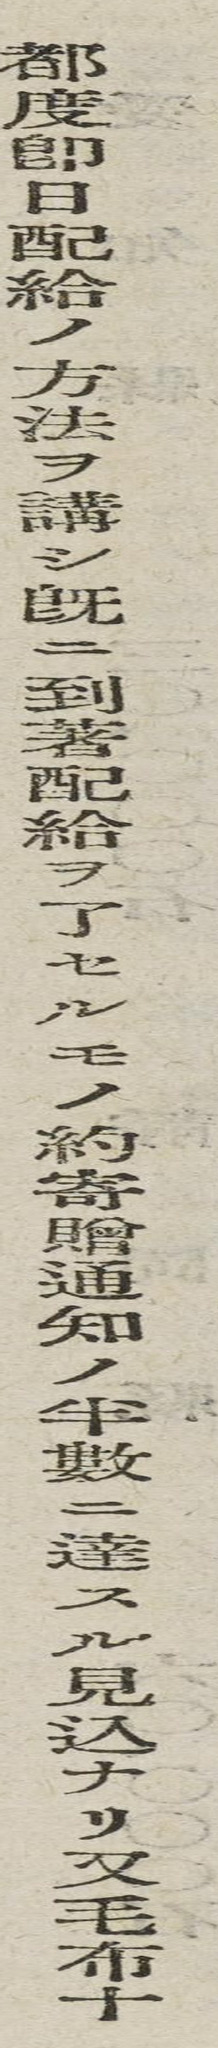都度即日配給ノ方法ヲ講シ既ニ到着配給ヲ了セルモノ約寄贈通知ノ半数ニ達スル見込ナリ又毛布十
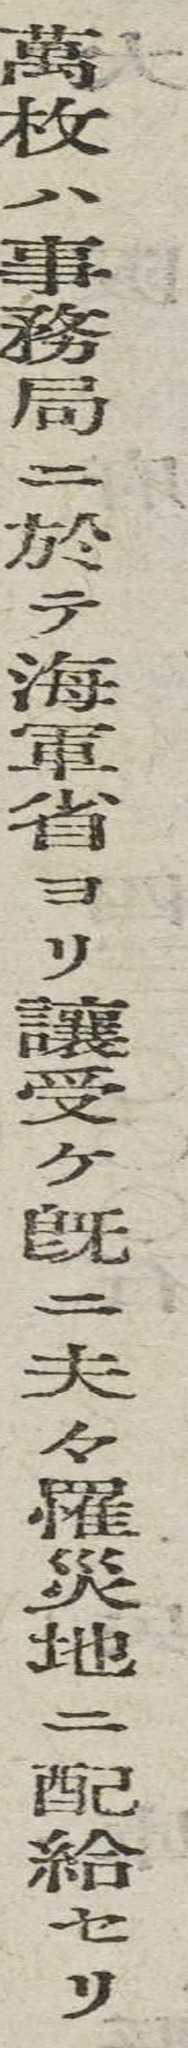一万枚ハ事務局ニ於テ海軍省ヨリ譲受ケ既ニ夫々罹災地ニ配給セリ
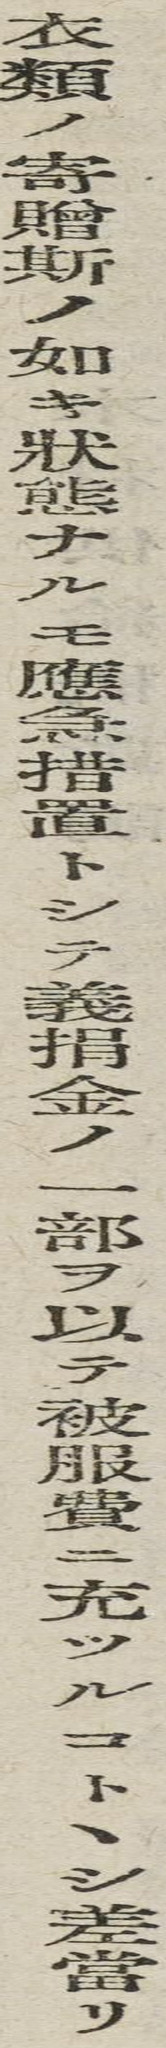衣類ノ寄贈斯ノ如キ状態ナルモ応急措置トシテ義捐金ノ一部ヲ以テ被服費ニ充ツルコトヽシ差当リ
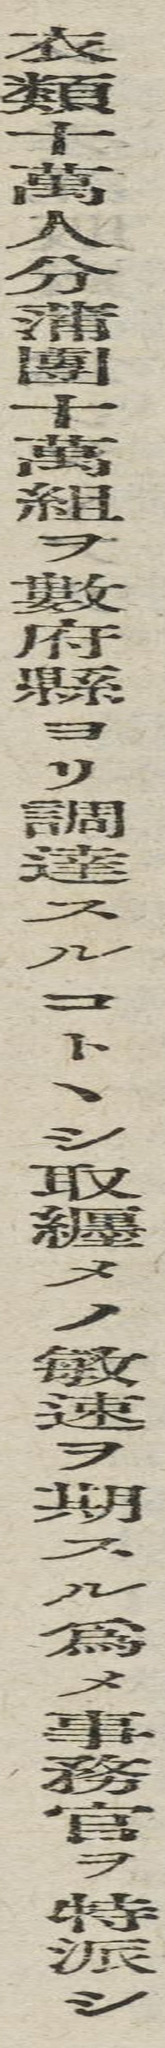衣類十万人分蒲団十万組ヲ数府県ヨリ調達スルコトヽシ取纏メノ敏速ヲ期スル為メ事務官ヲ特派シ
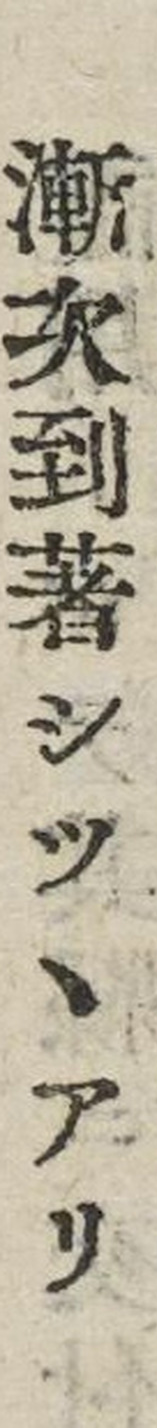漸次到着シツヽアリ
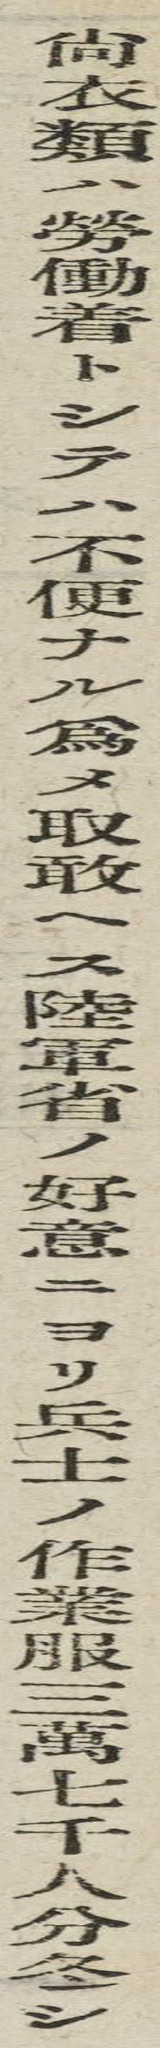尚衣類ハ労働着トシテハ不便ナル為メ取敢ヘス陸軍省ノ好意ニヨリ兵士ノ作業服三万七千人分冬シ
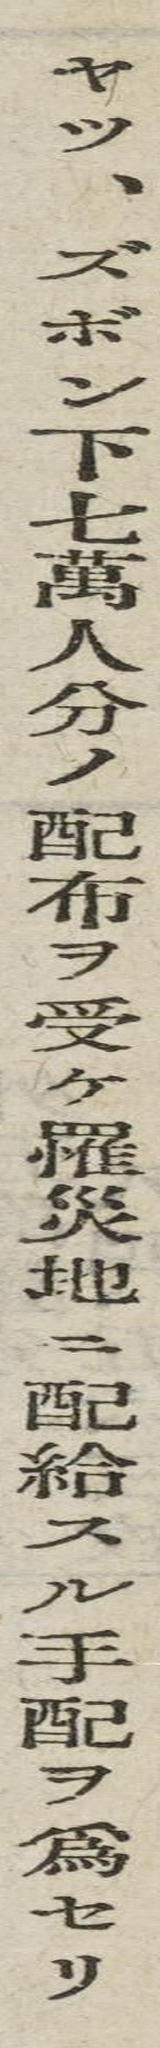ヤツ、ズボン下七万人分ノ配給ヲ受ケ罹災地ニ配給スル手配ヲ為セリ
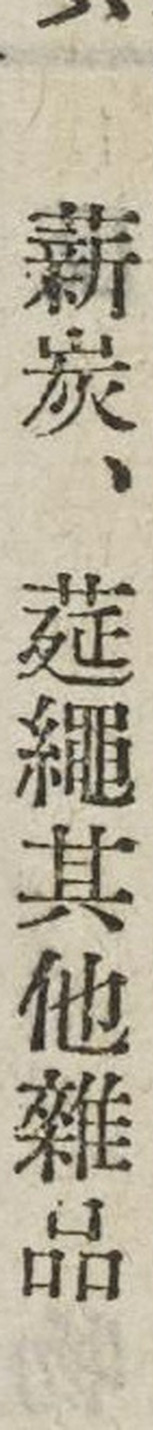薪炭、筵縄其他雑品
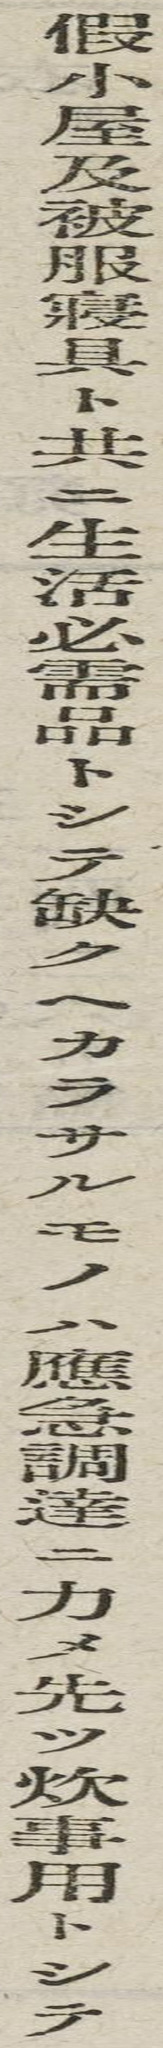仮小屋及被服寝具ト共ニ生活必需品トシテ欠クヘカラサルモノハ応急調達ニ力メ先ツ炊事用トシテ
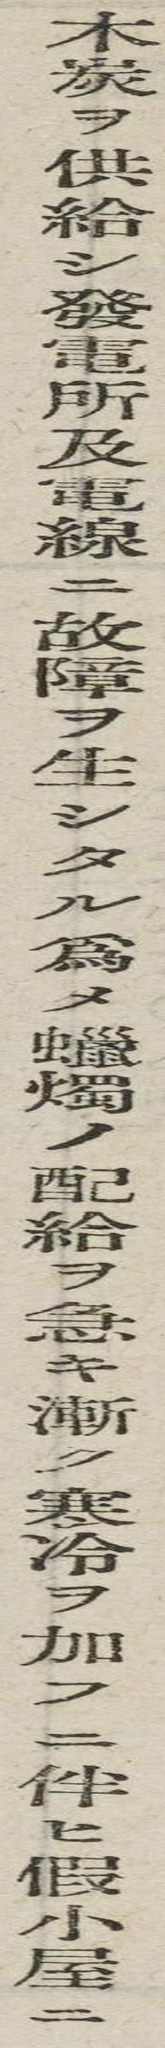木炭ヲ供給シ発電所及電線ニ故障ヲ生シタル為メ蝋燭ノ配給ヲ急キ漸ク寒冷ヲ加フニ伴ヒ仮小屋ニ
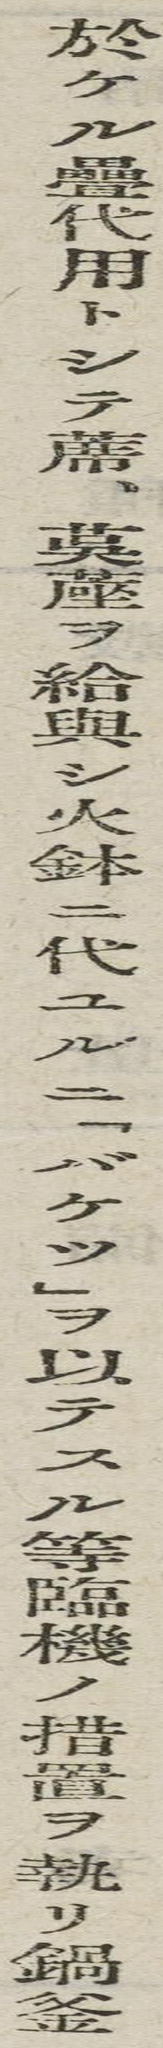於ケル畳代用トシテ蓆、茣蓙ヲ給与シ火鉢ニ代ユルニ「バケツ」ヲ以テスル等臨機ノ措置ヲ執リ鍋釜
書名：震災被害状況並救護施設概要
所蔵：東京大学地震研究所図書室 Earthquake Research Institute Library, The University of Tokyo, JAPAN
